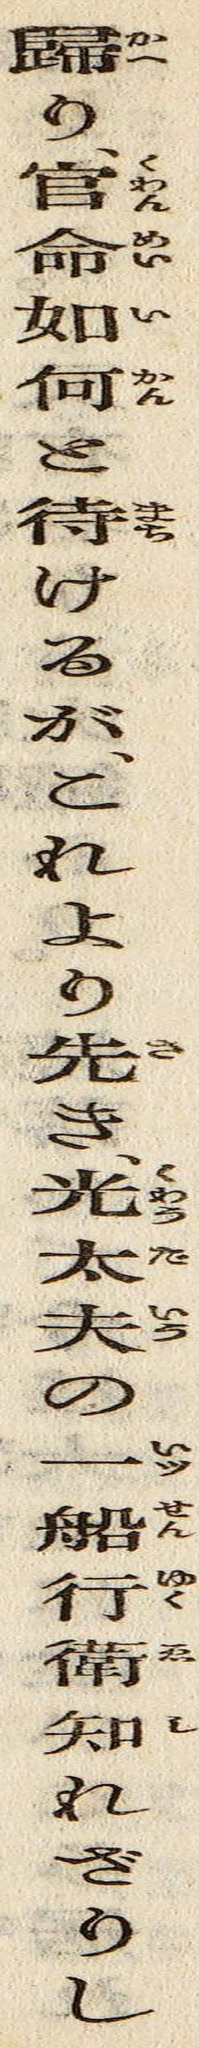帰り、官命如何と待けるが、これより先き、光太夫の一船行衛知れざりし
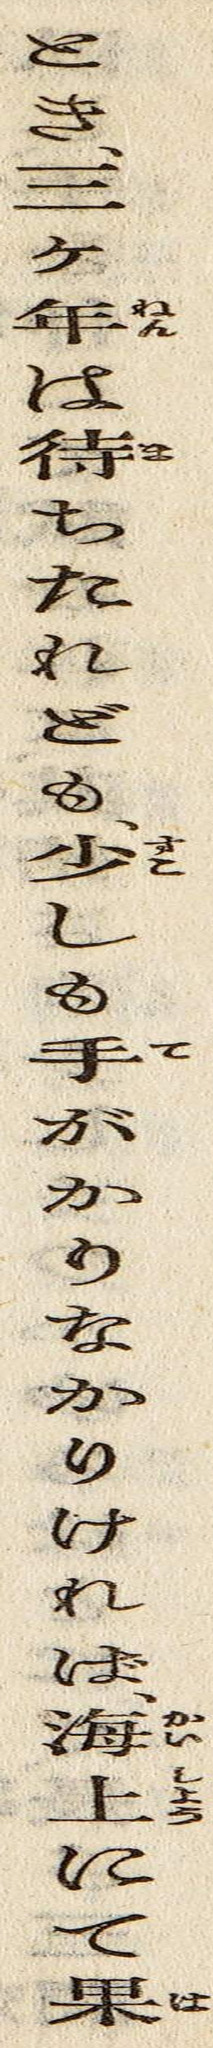とき、三ヶ年は待ちたれども、少しも手がかりなかりければ、海上にて果
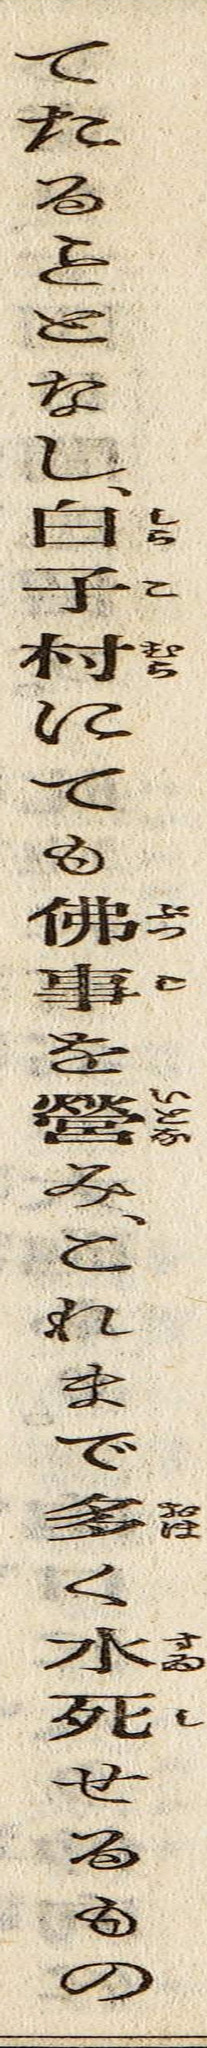てたることとなし、白子村にても仏事を営み、これまで多く水死せるもの
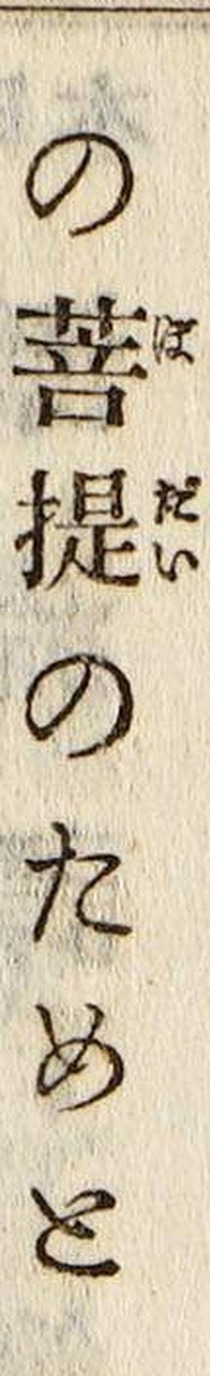の菩提のためと
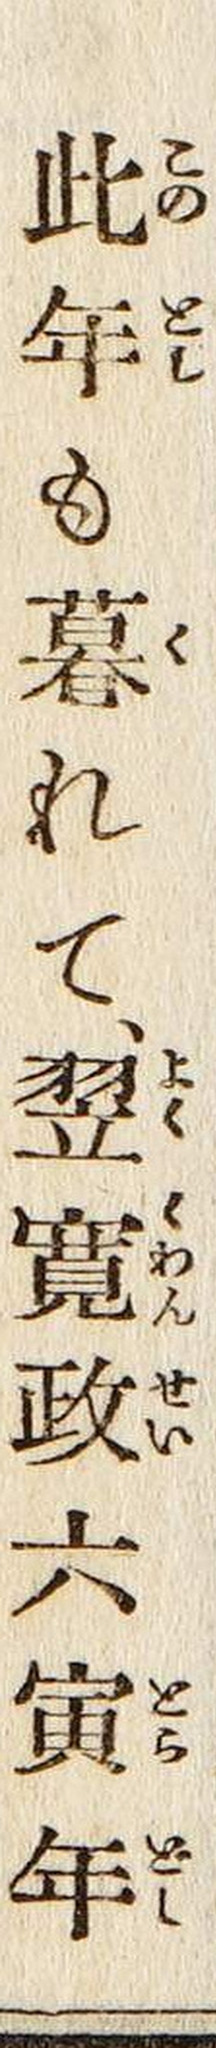此年も暮れて、翌寛政六寅年
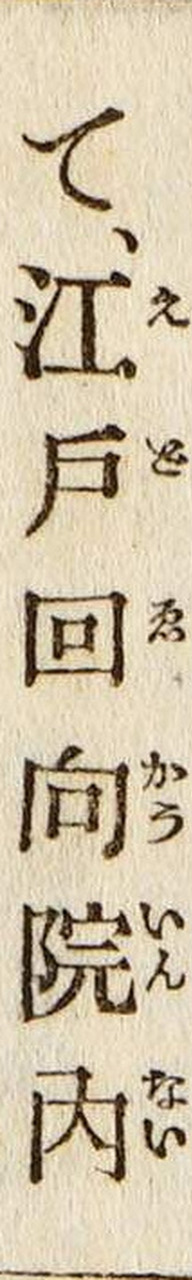て、江戸回向院内
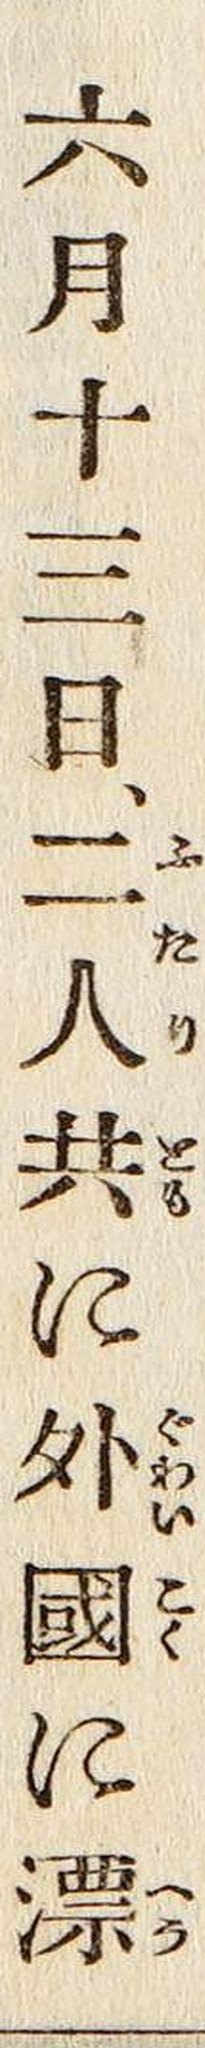六月十三日、二人共に外国に漂
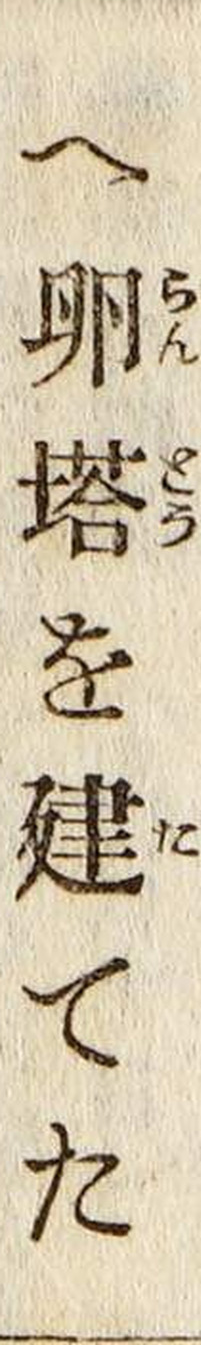へ卵塔を建てた
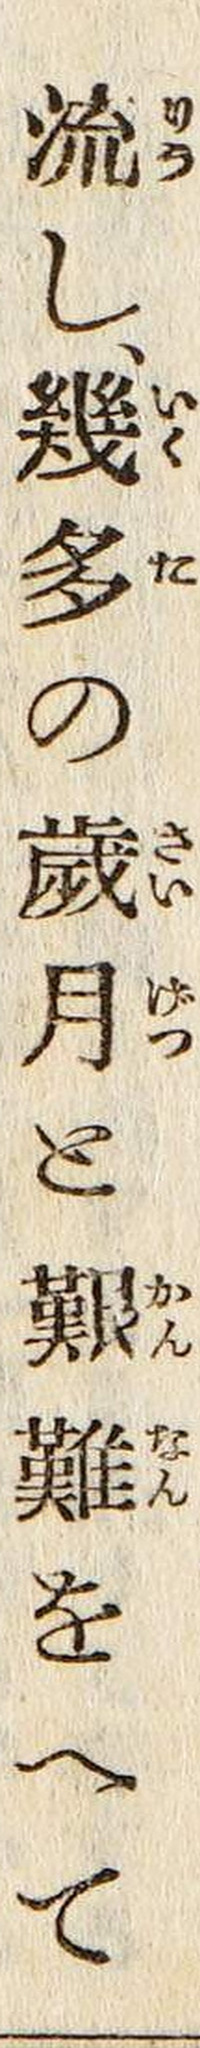流し、幾多の歳月と艱難をへて
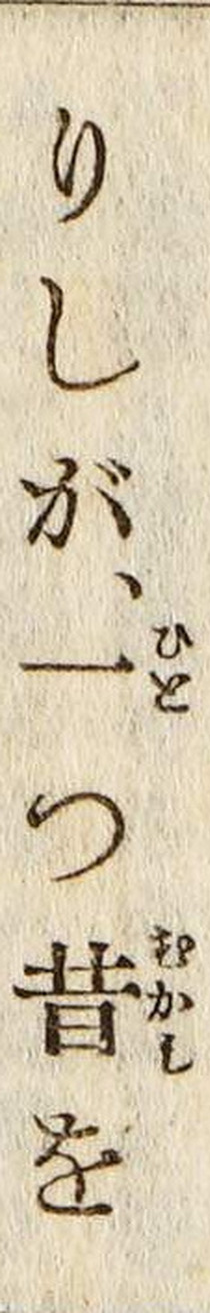りしが、一つ昔を
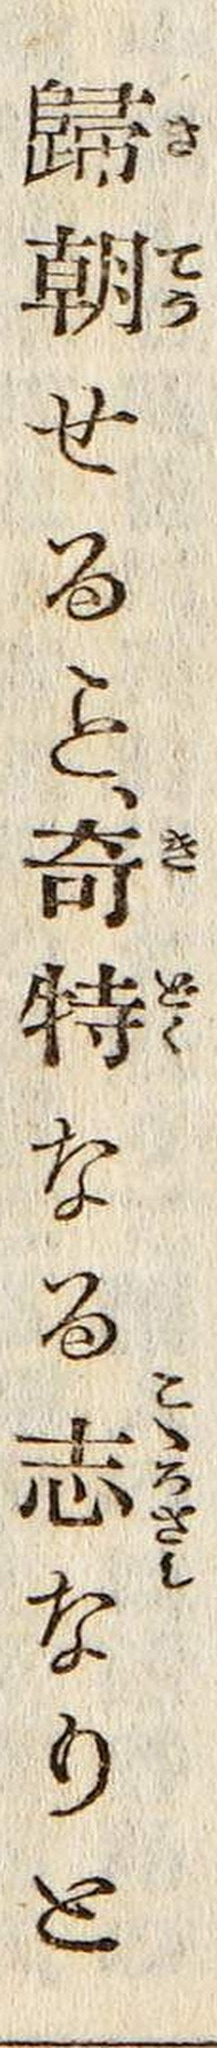帰朝せること、奇特なる志なりと
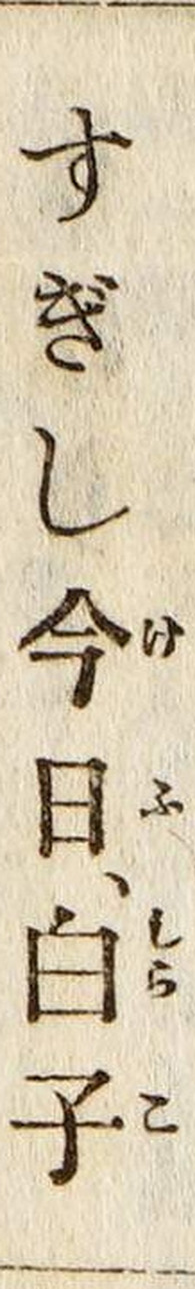すぎし今日、白子
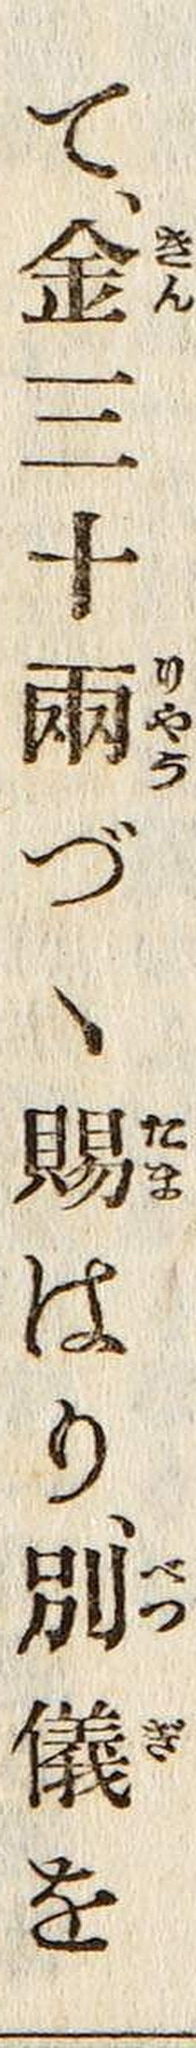て、金三十両づゝ賜はり、別儀を
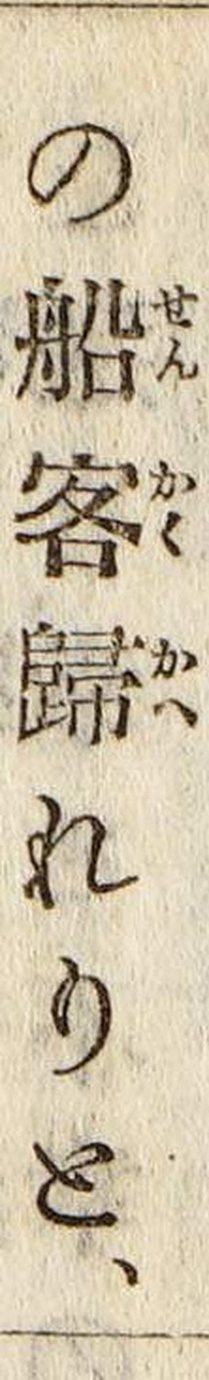の船客帰れりと、
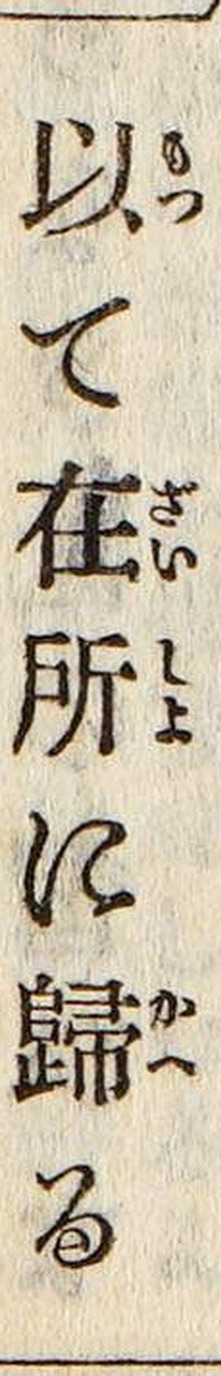以て在所に帰る
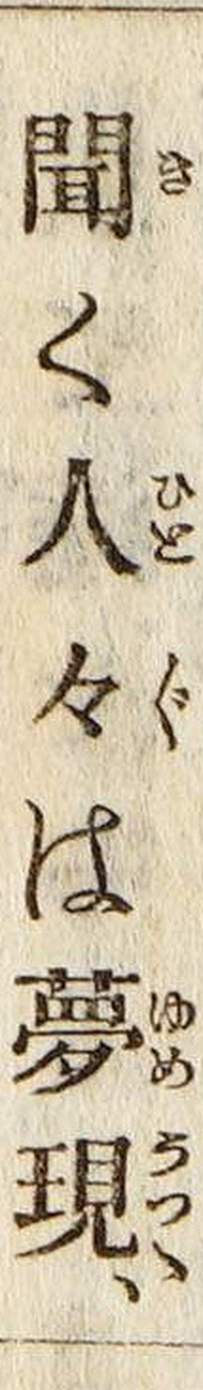聞く人々は夢現、
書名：日本漂流譚
